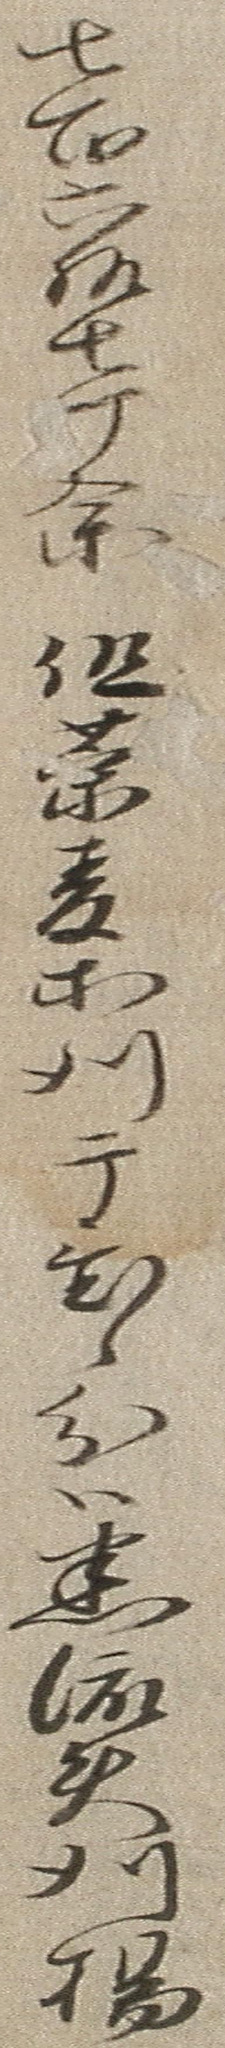七百六拾七丁余但藁麦等刈干置候分は悉流失刈揚
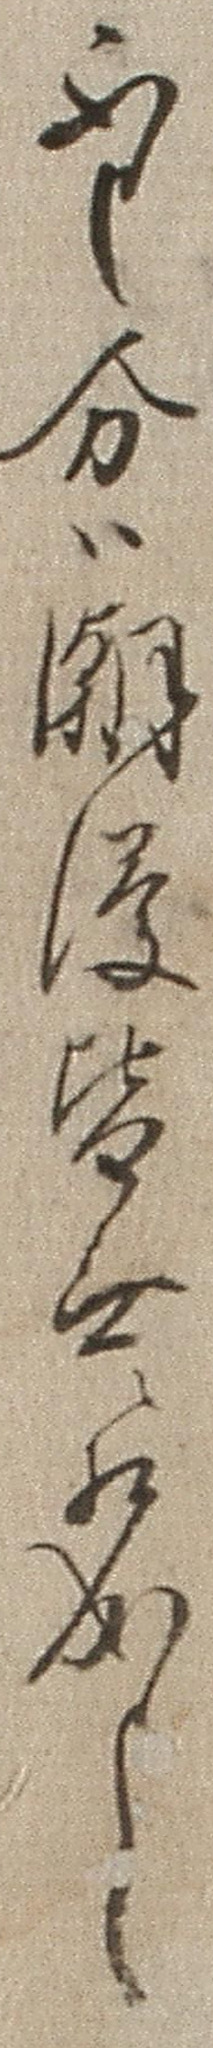不申分は潮浸皆無に相成申候
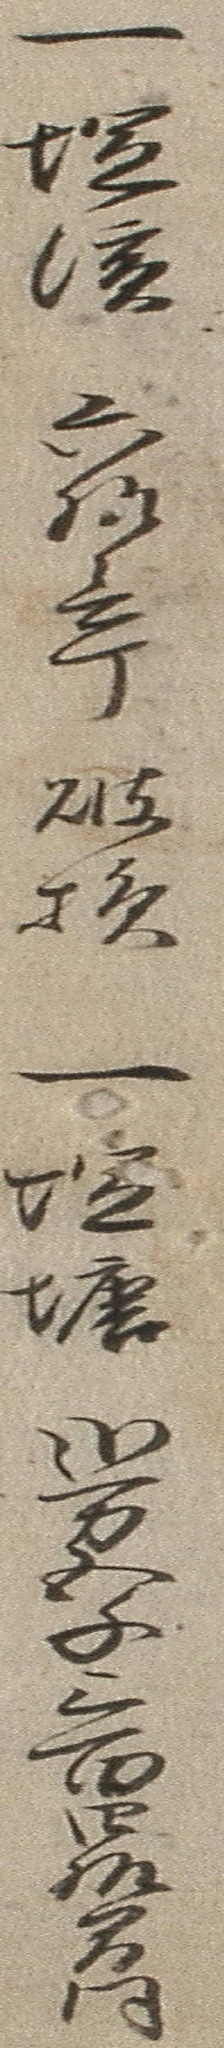一塩浜六拾壱丁破損一塩塘弐万五千三百四拾間同
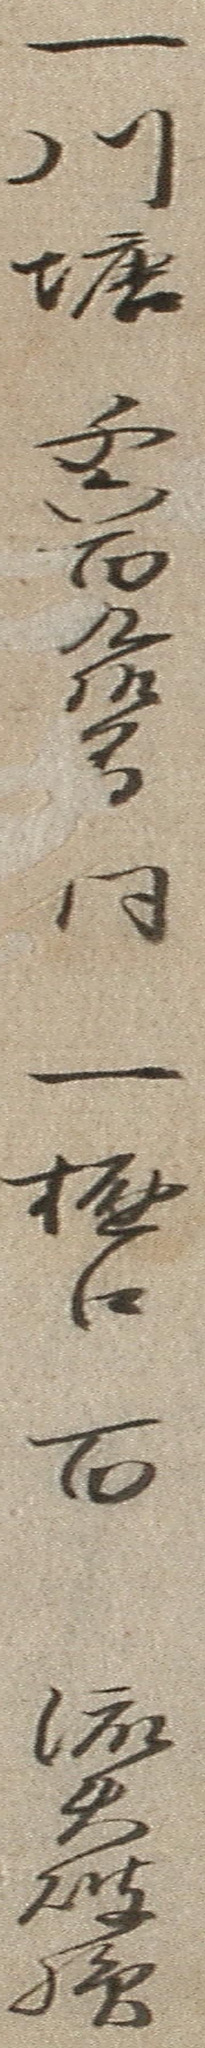一川塘千六百九拾間同一樋口百流失破損
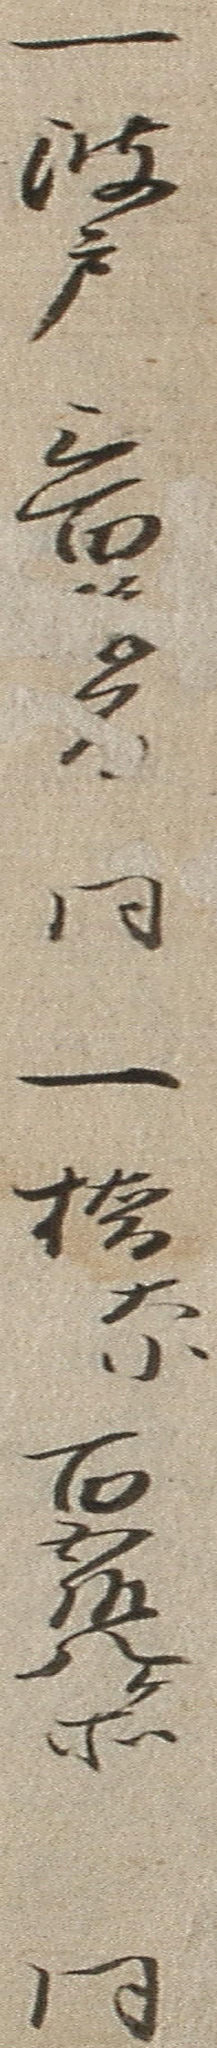一波戸三百拾五？間同一橋大小百五拾八ヶ所同
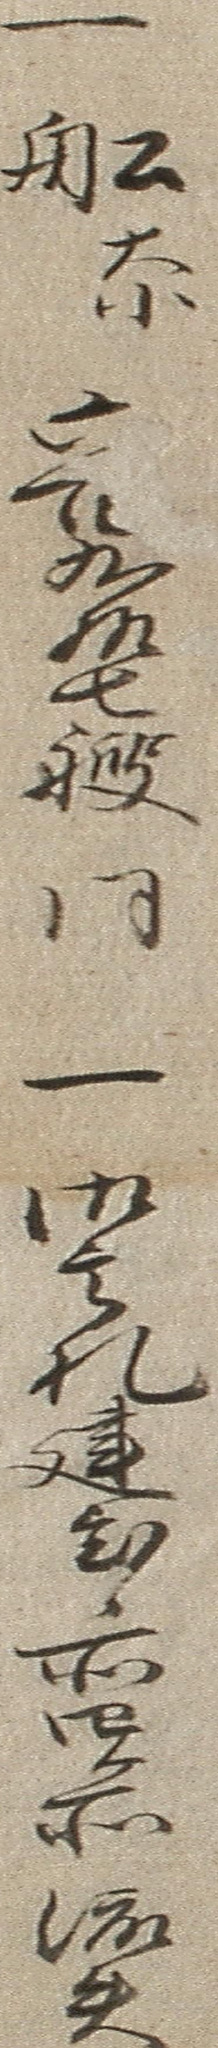一船大小六百九拾七艘同一御高札建置候所四ヶ所流失
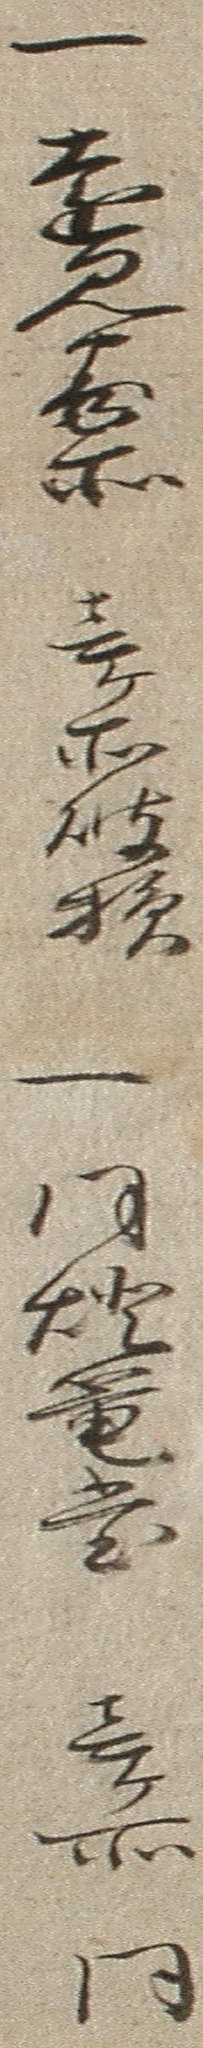一遠見番所壱ヶ所破損一同燈篭堂壱ヶ所同
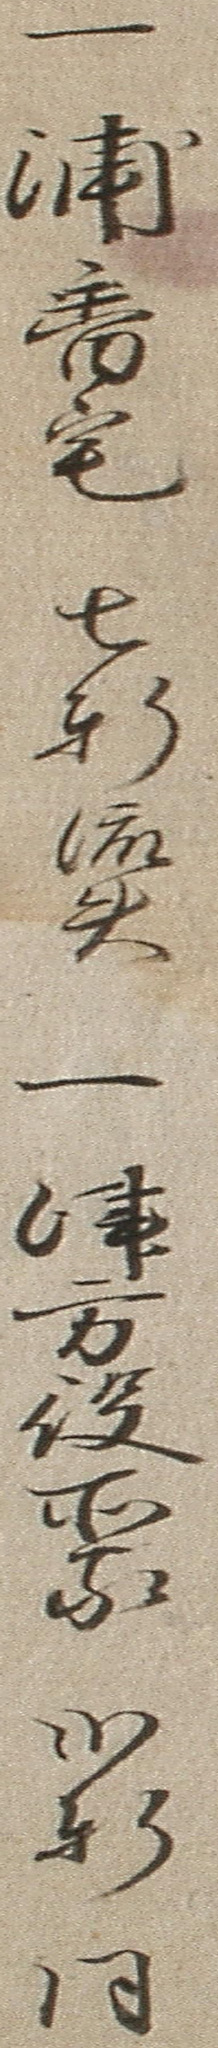一浦番宅七軒流失一津方役所家弐軒同
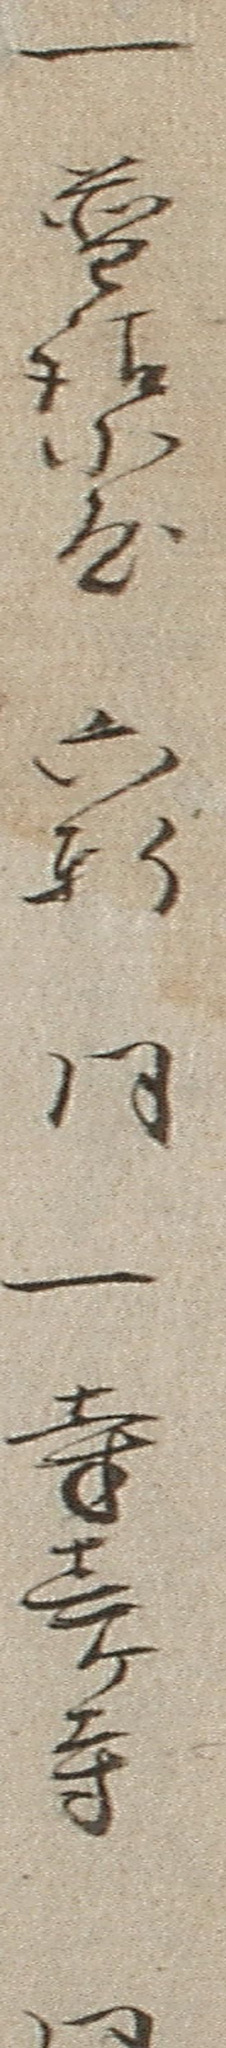一普請小屋六軒同一寺壱ヶ寺同
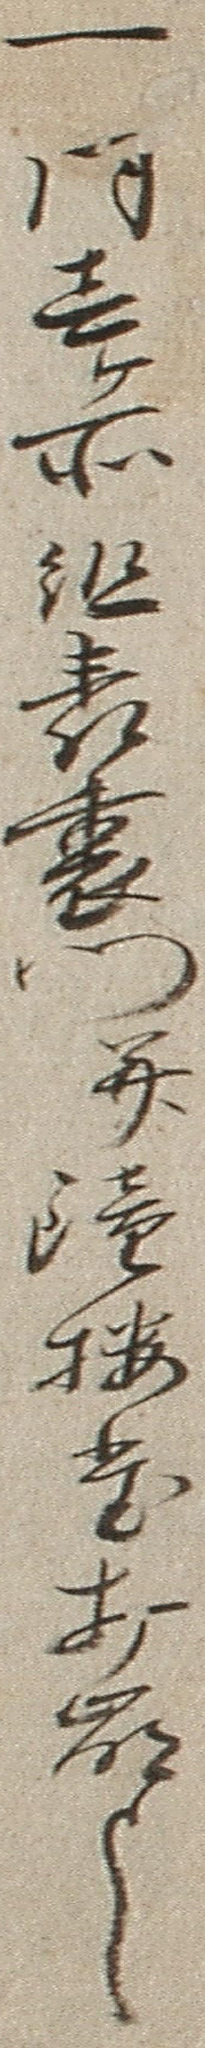一同壱ヶ所組表裏門并鐘楼堂打崩申候
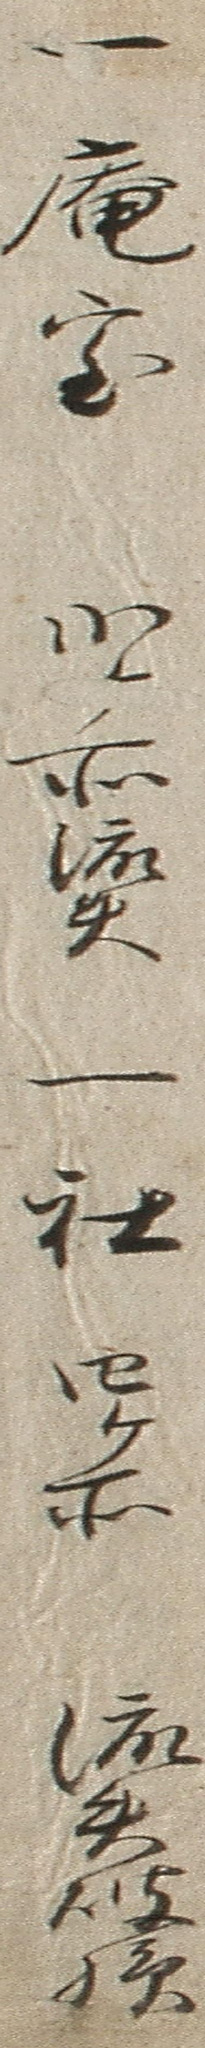一庵室弐ヶ所流失一社四ヶ所流失破損

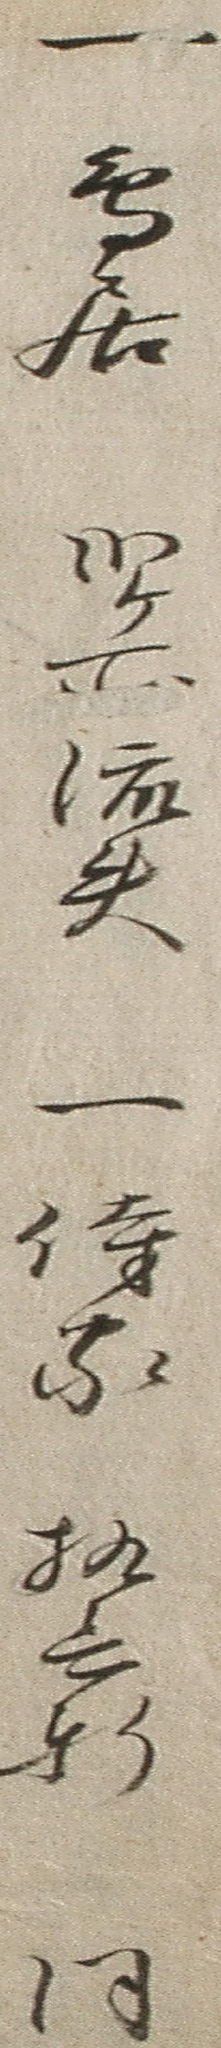一鳥居弐ヶ所流失一侍家拾壱軒同
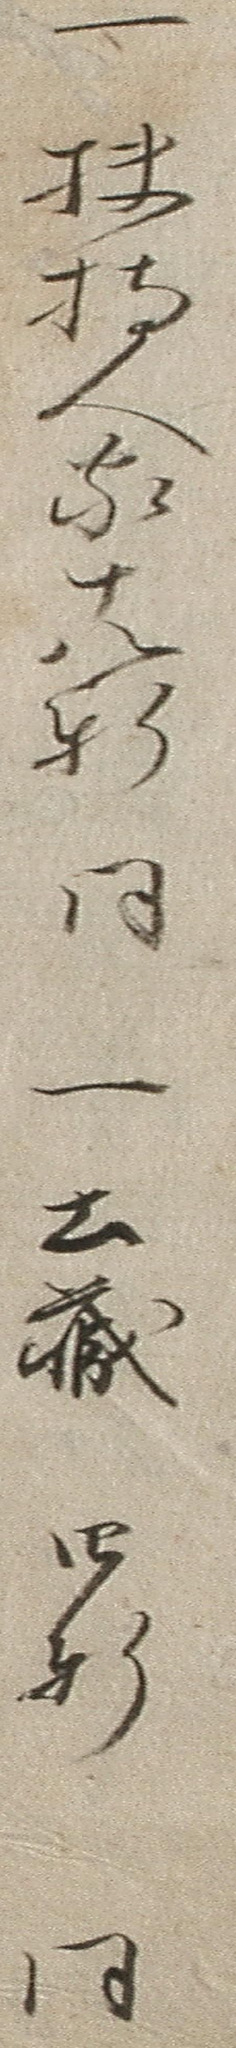一扶持人家十八軒同一土蔵四軒同
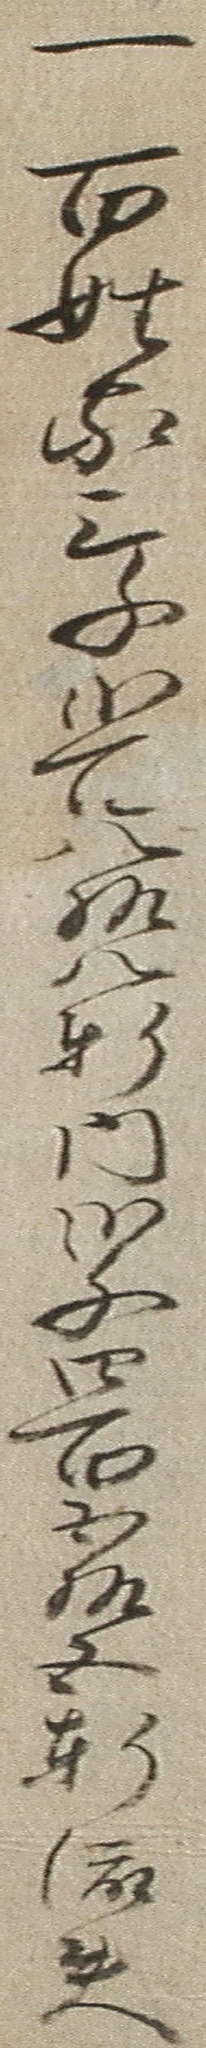一百姓家三千弐百八拾八軒内弐千四百五拾五軒流失
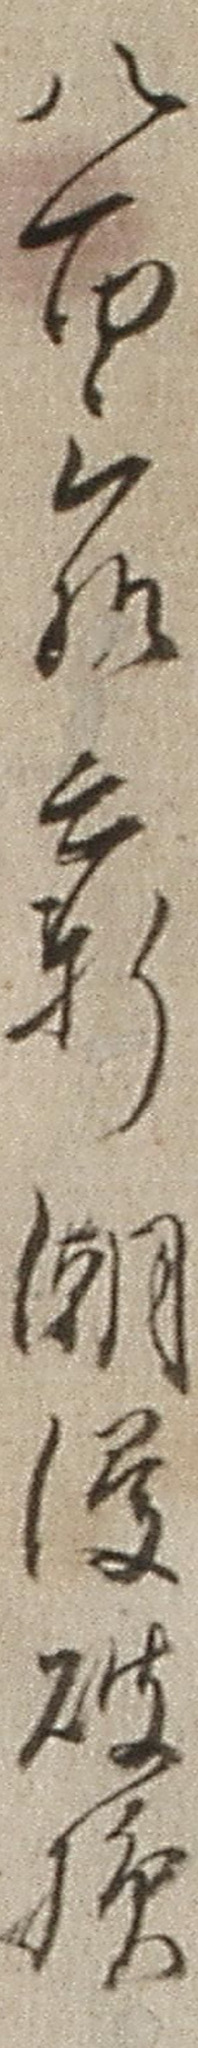八百三拾壱軒潮浸破損
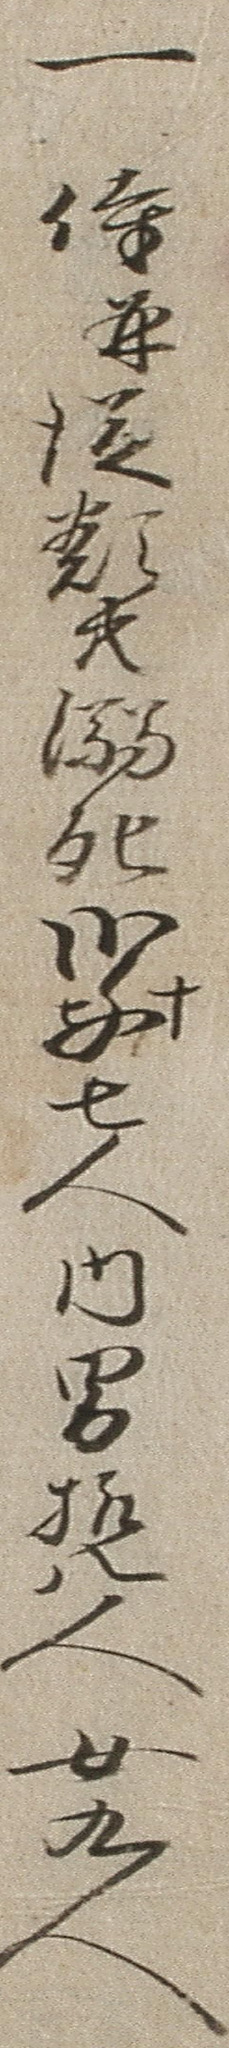一侍并従類共溺死弐十七人内男拾八人女九人
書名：太平秘録抜書　浅間山燒及普賢山崩
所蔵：東京大学地震研究所図書室 Earthquake Research Institute Library, The University of Tokyo, JAPAN
